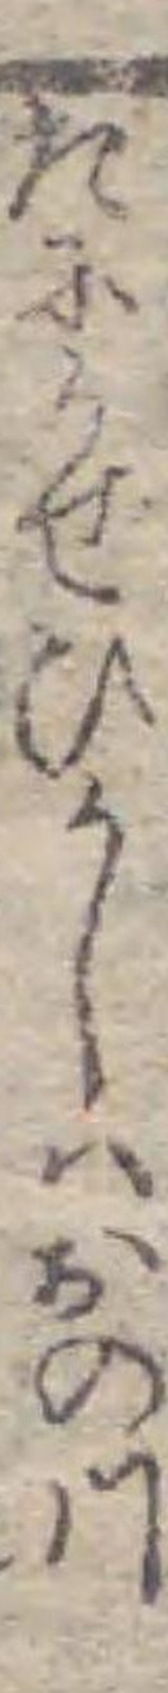たにかぜひかしはおの川
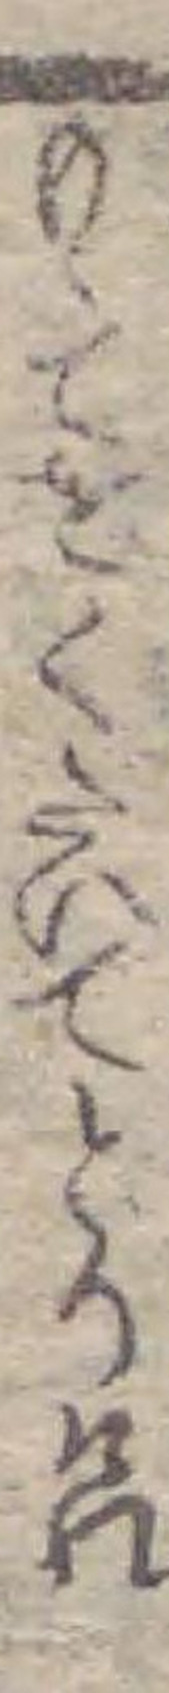もゝてをくたいてとりけれ
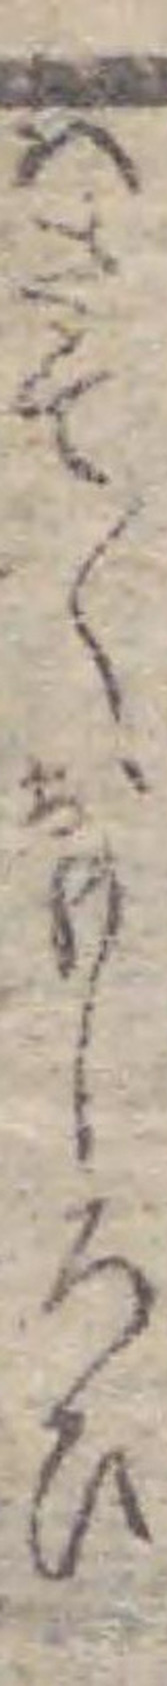はさて〳〵おもしろひ
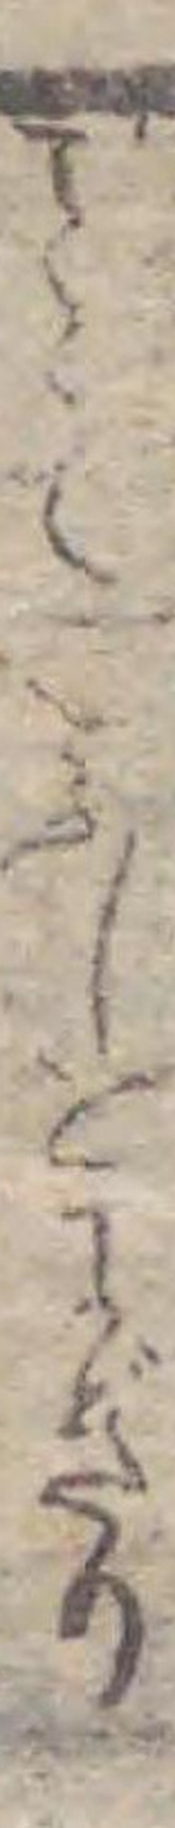ことゝてこふしをにぎり
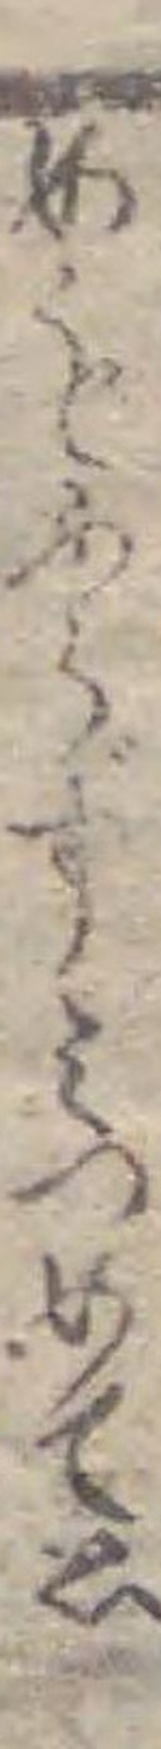めをふらずみつめて思
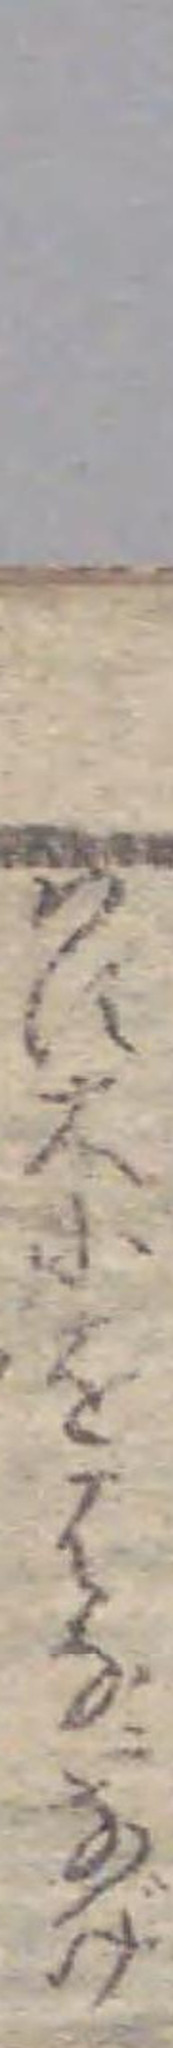はす大小をはなになげ
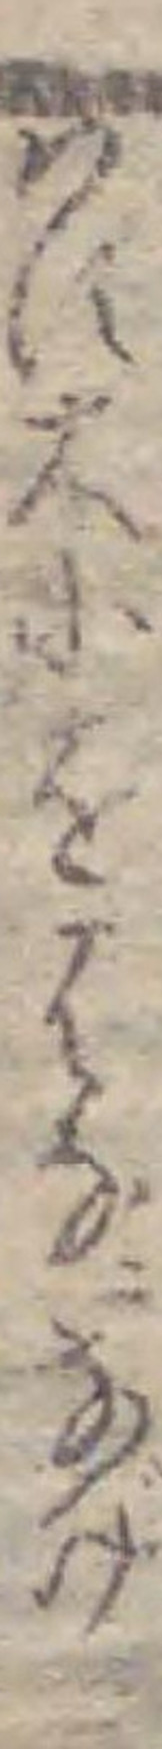はす大小をはなになげ
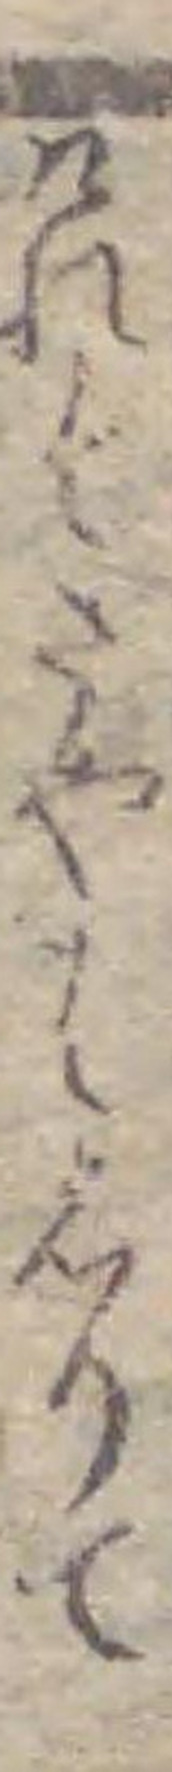ければさやはしりて
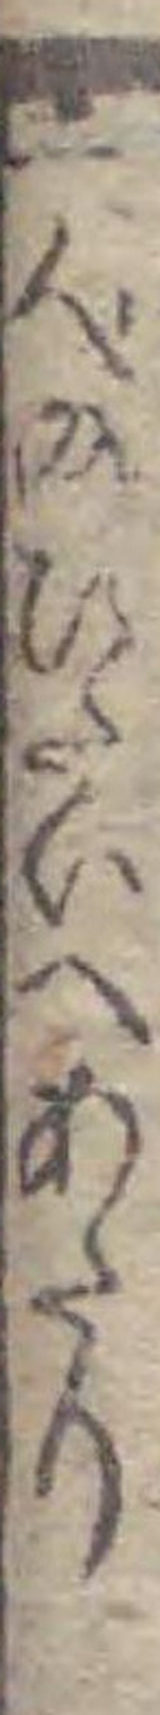二人のひたいへあたり
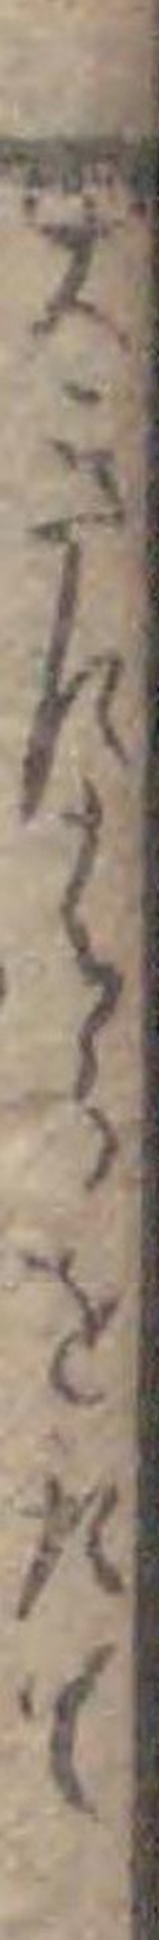大きにはらをたて
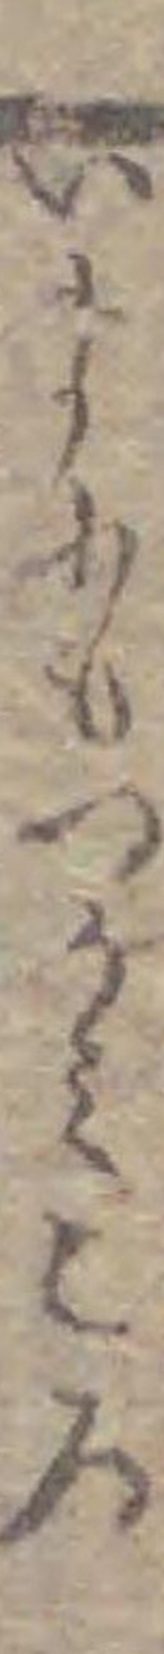いまにもつかみころ
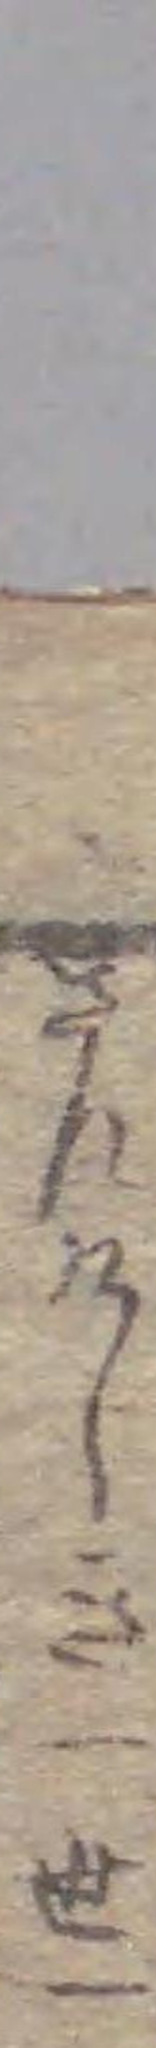さんけしき一世一
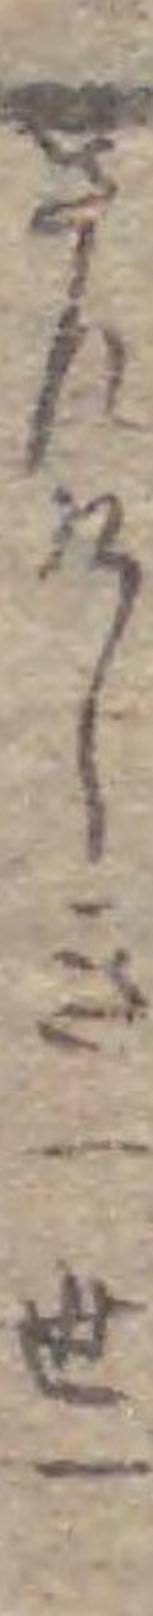さんけしき一世一
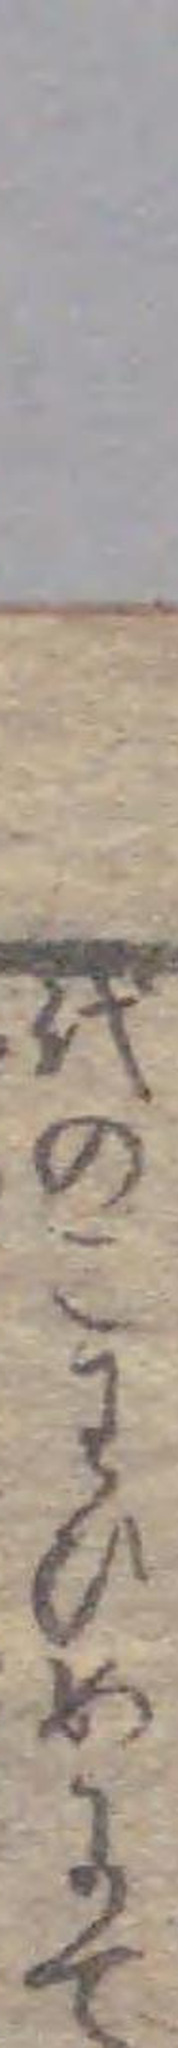代のこわひめにて
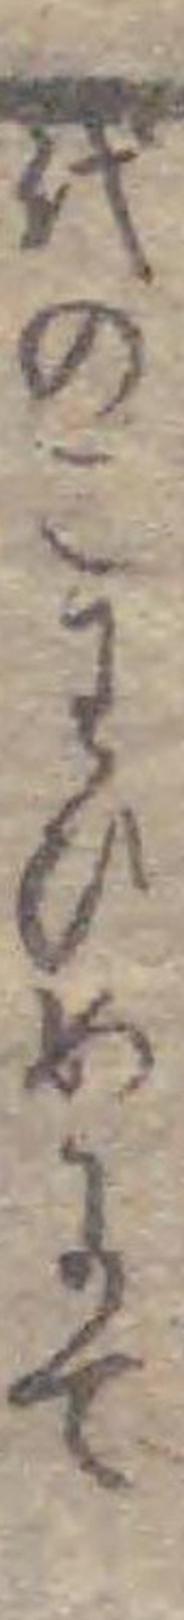代のこわひめにて
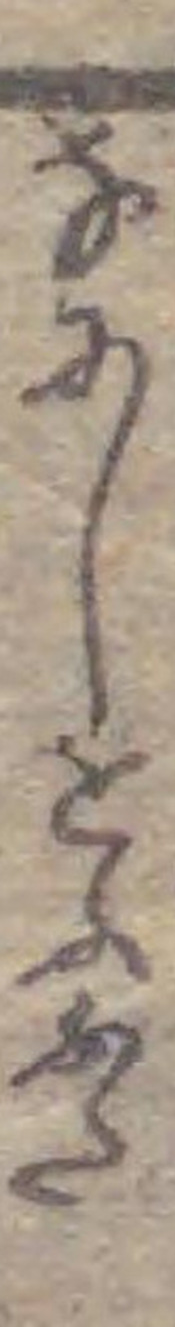なにしをふふた
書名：紺屋百物語 : 3巻
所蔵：国立国会図書館 National Diet Library, JAPAN
